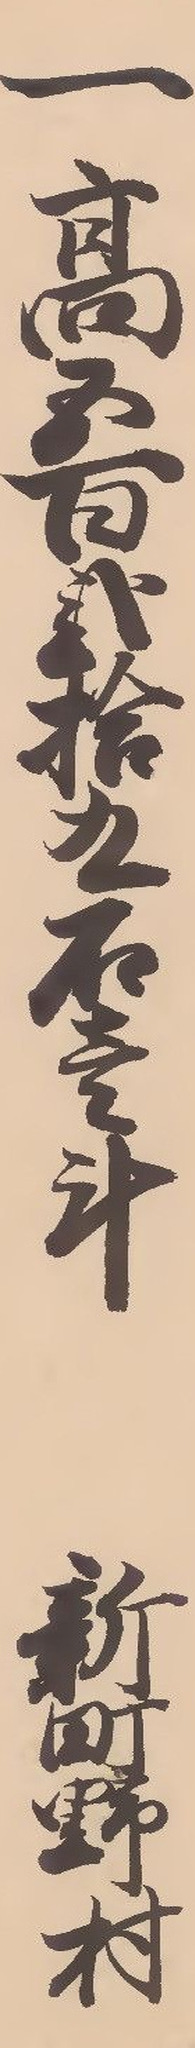一高五百弐拾九石壱斗新町野村
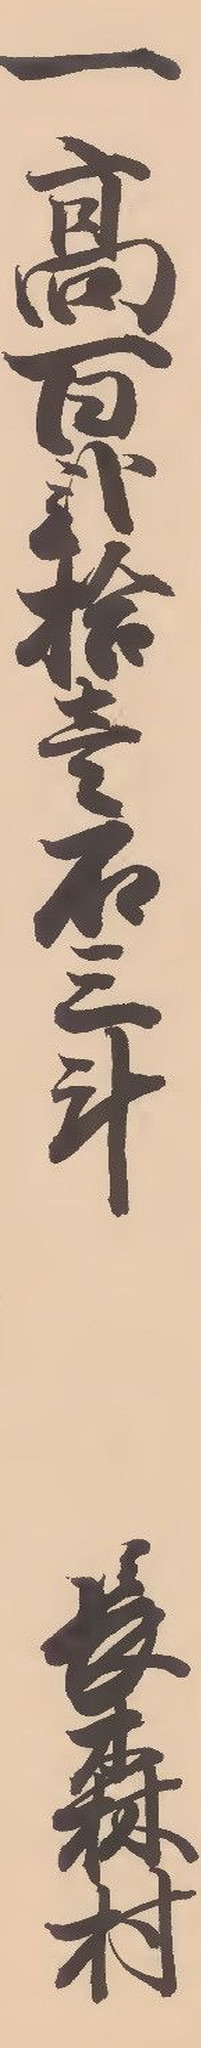一高百弐拾壱石三斗長森村
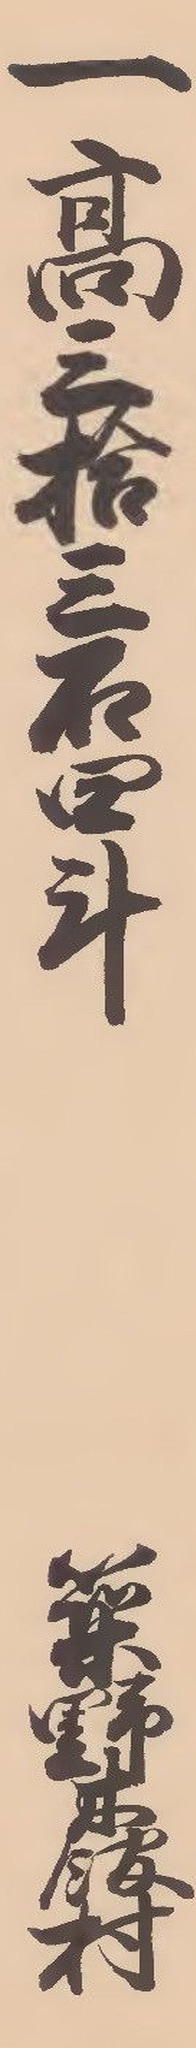一高三拾三石四斗築野木館村
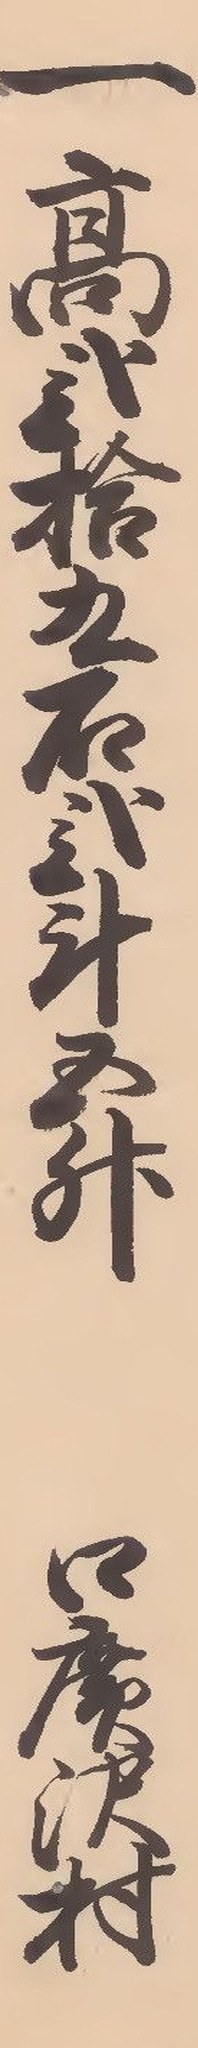一高弐拾九石弐斗五升口広沢村

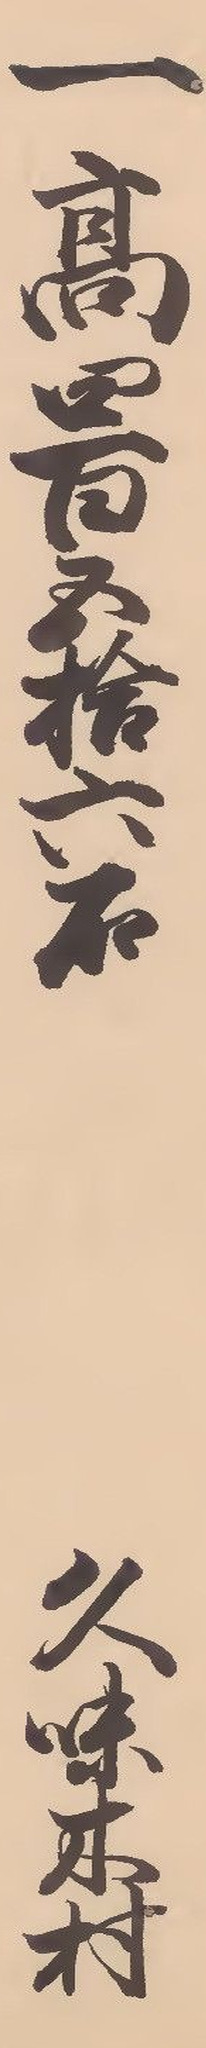一高四百五拾六石久味木村
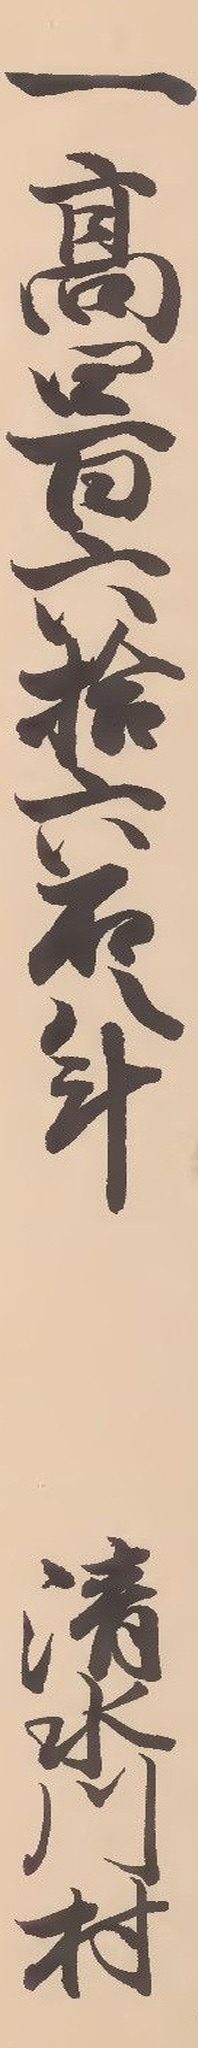一高四百六拾六石八斗清水川村
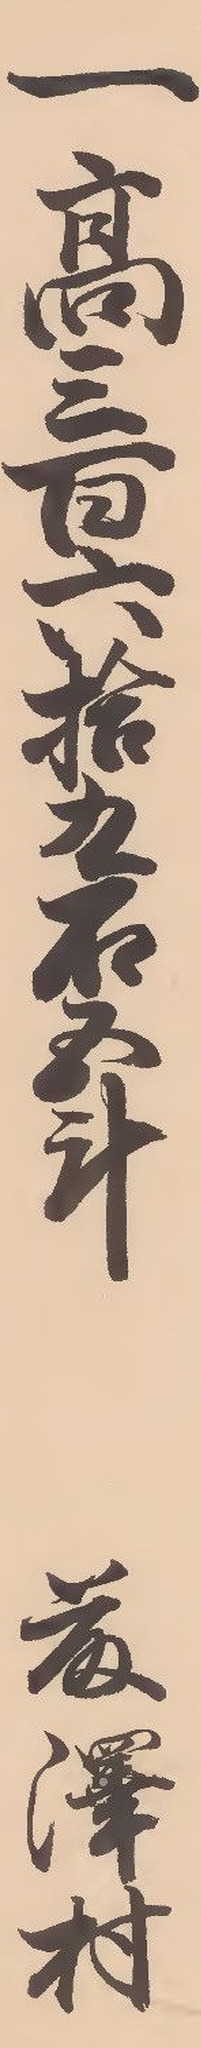一高三百六拾九石五斗藤沢村
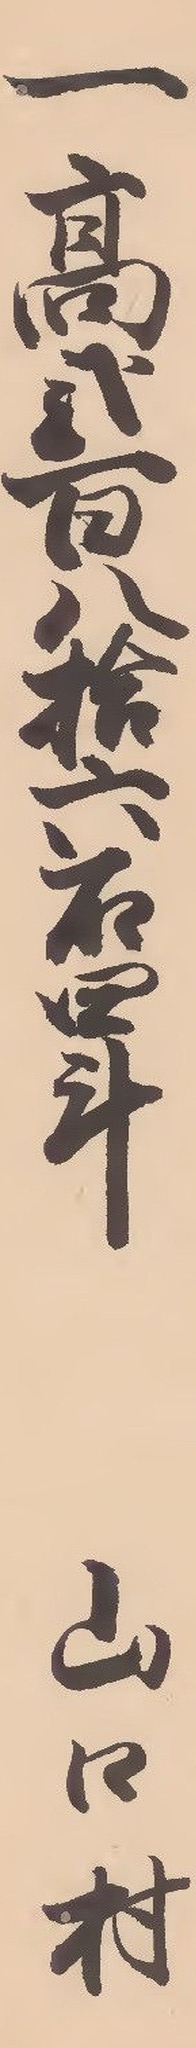一高弐百八拾六石四斗山口村

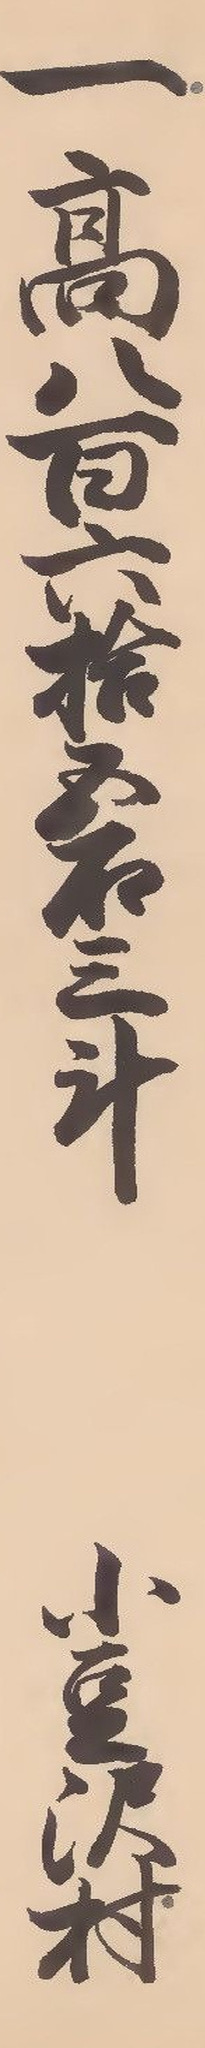一高八百六拾五石三斗小豆沢村
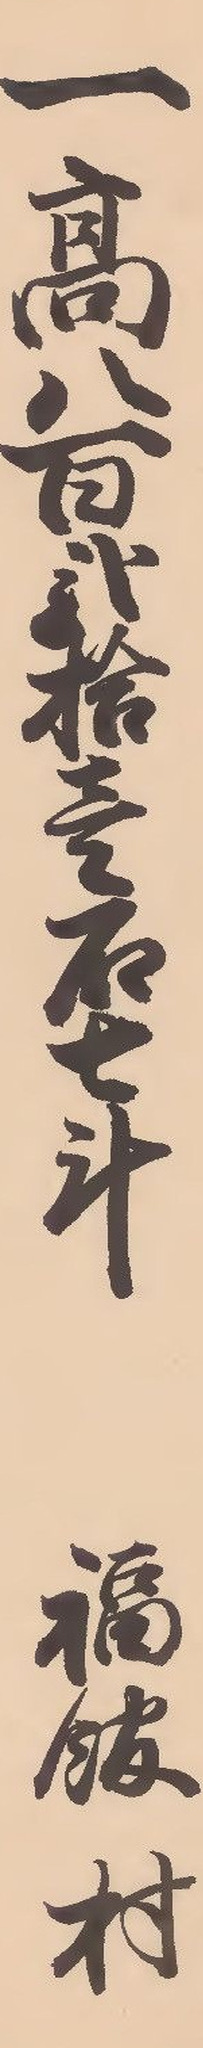一高八百弐拾壱石七斗福館村
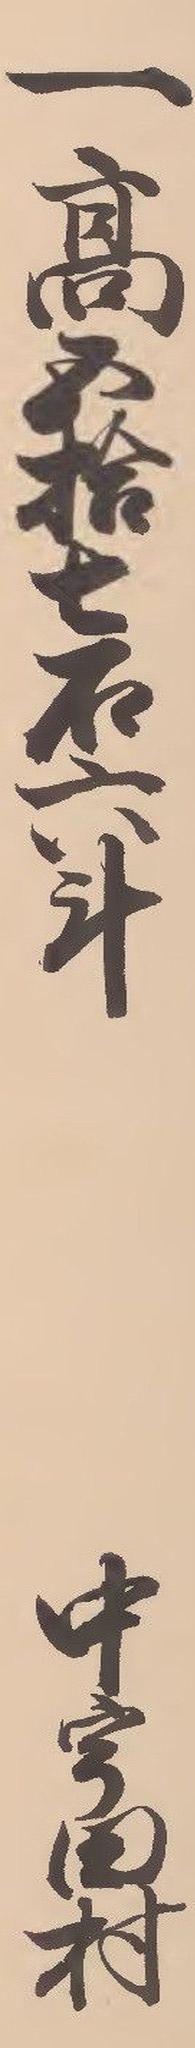一高五拾七石六斗中宇田村
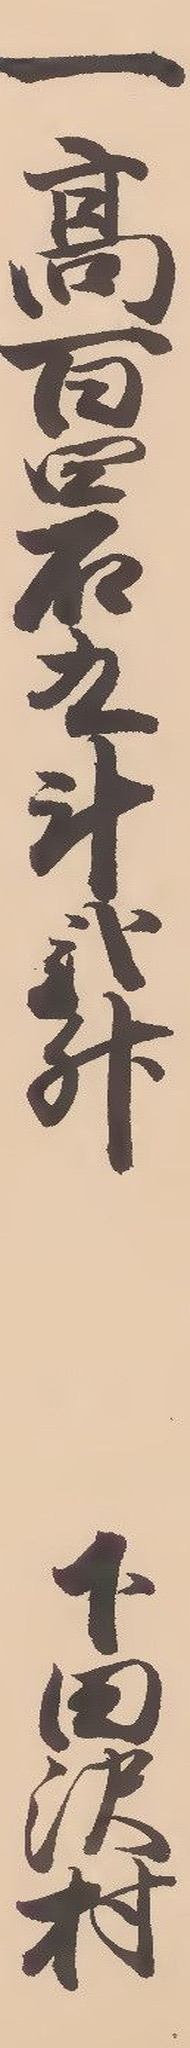一高百四石九斗弐升下田沢村
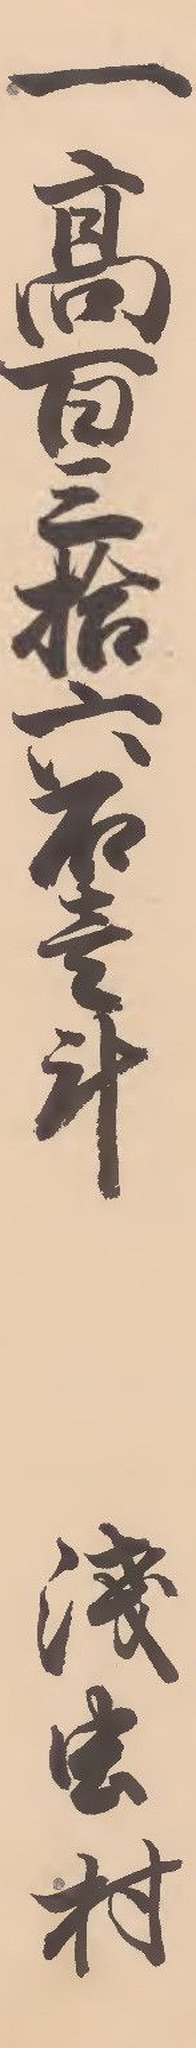一高百三拾六石壱斗浅虫村

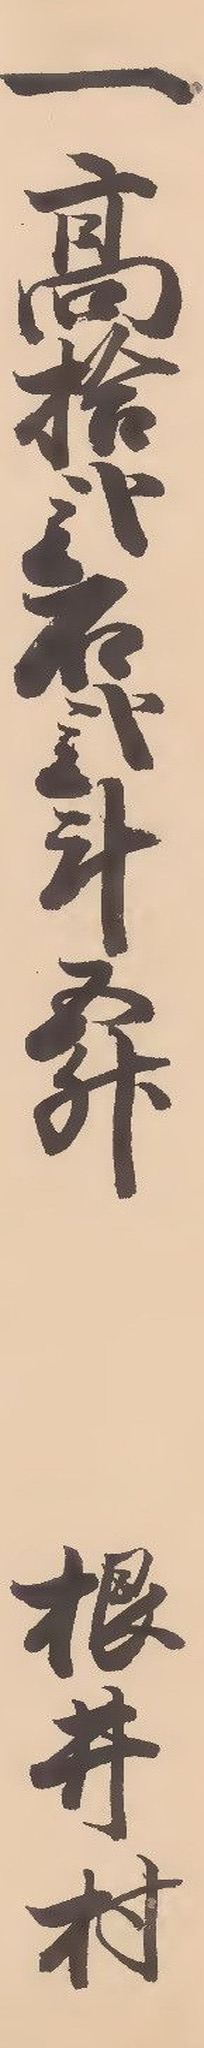一高拾弐石弐斗五升根井村
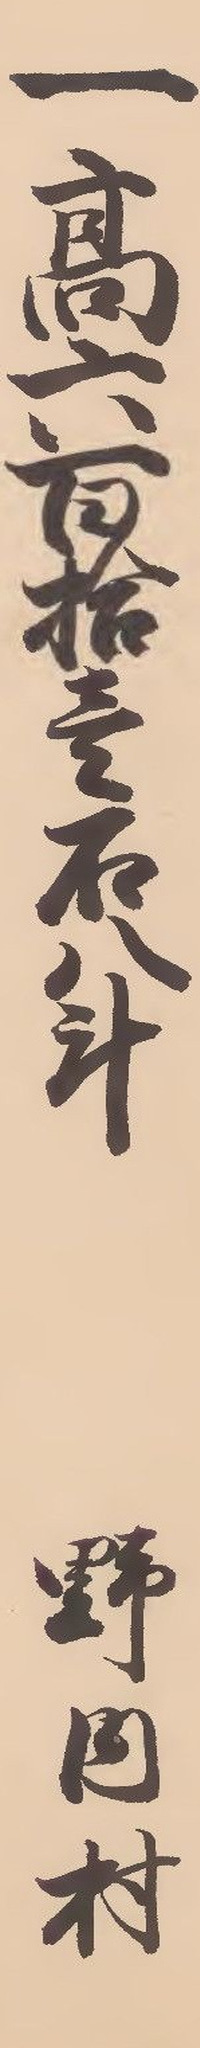一高六百拾壱石八斗野内村
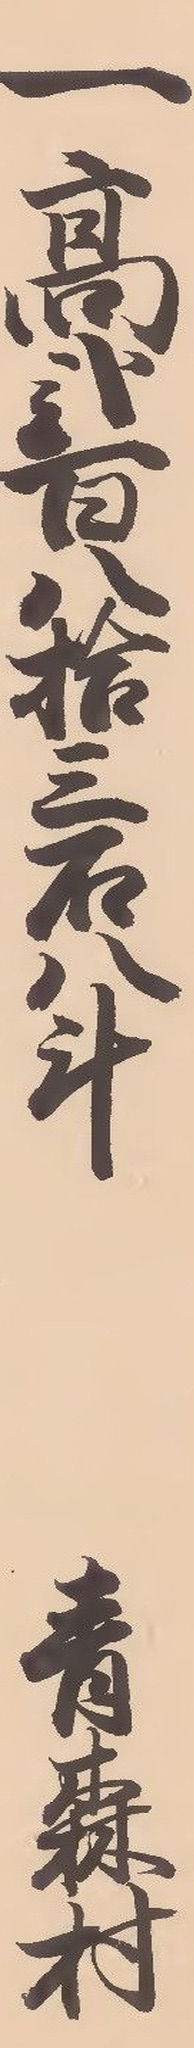一高弐百八拾三石八斗青森村
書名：陸奥国郷帳　７
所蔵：国立公文書館 National Archives of Japan
